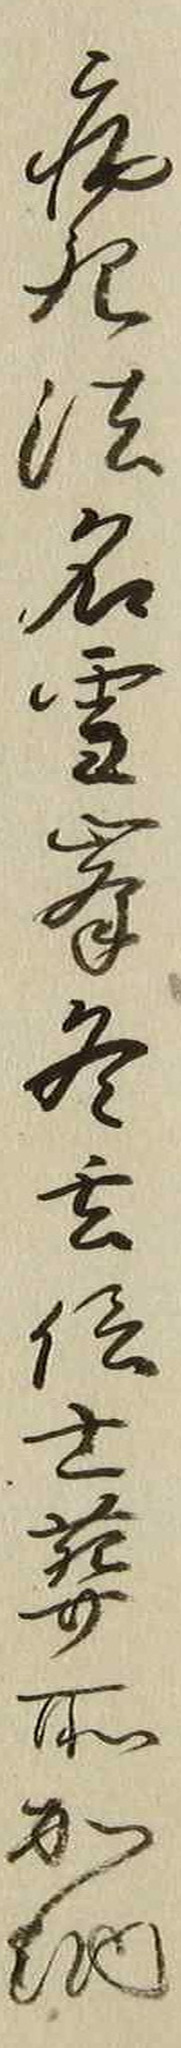病死法名雪峯冬玄信士葬所加納
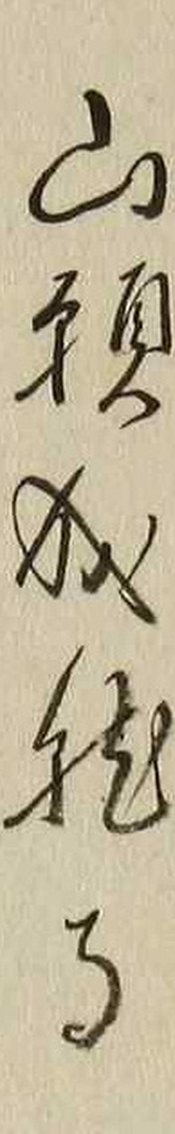山願成就寺
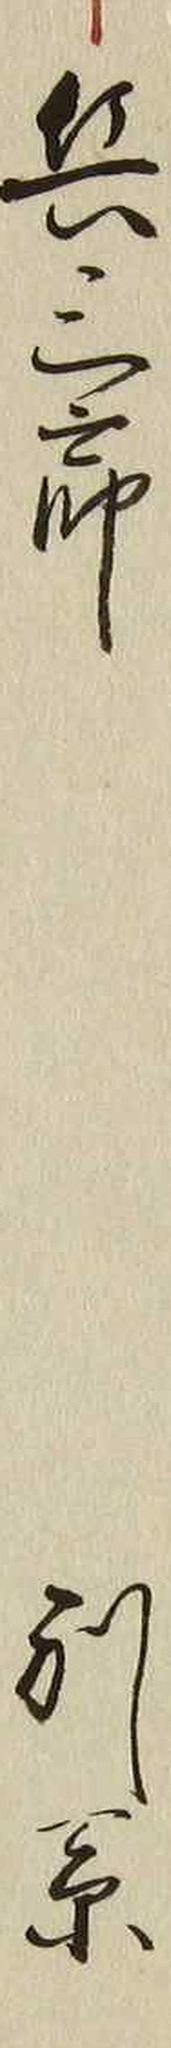兵三郎別系
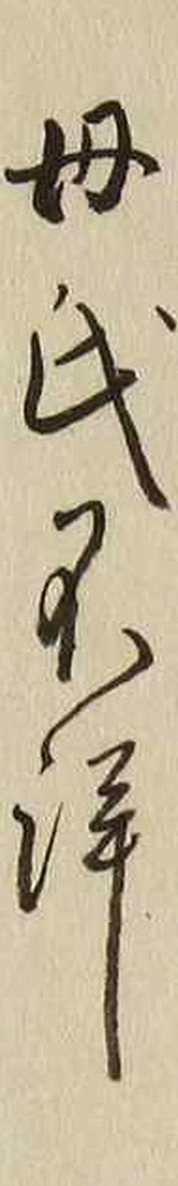母氏不詳
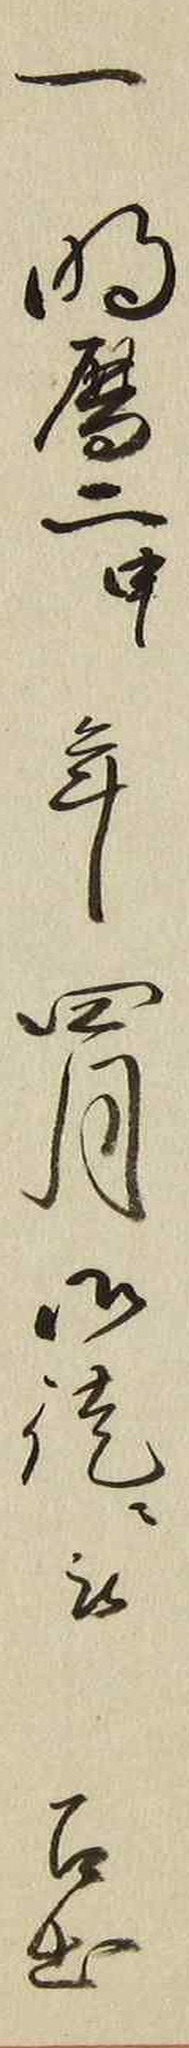一明暦二申年御徒に被召出

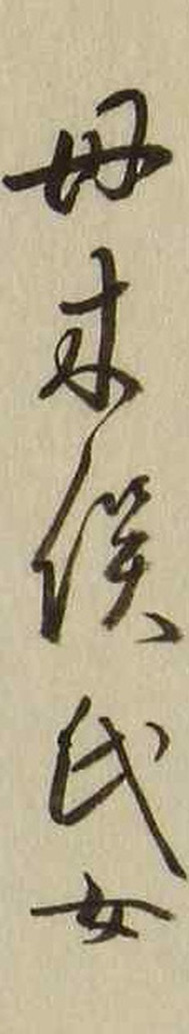母木俣氏女
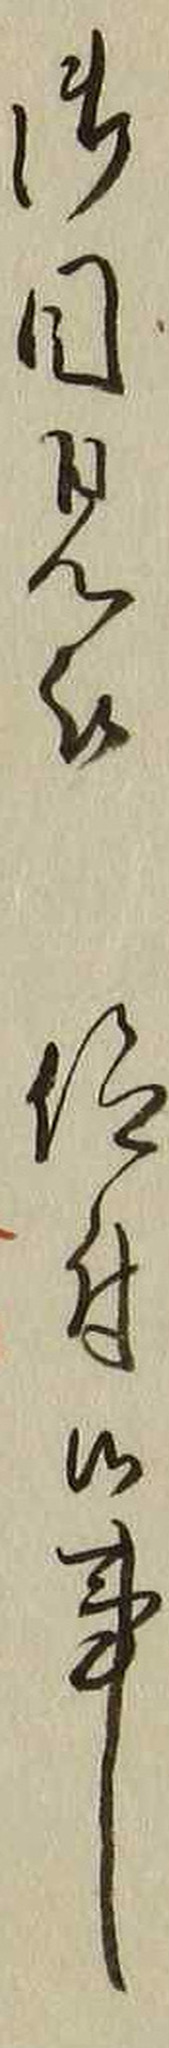御目見被仰付候事
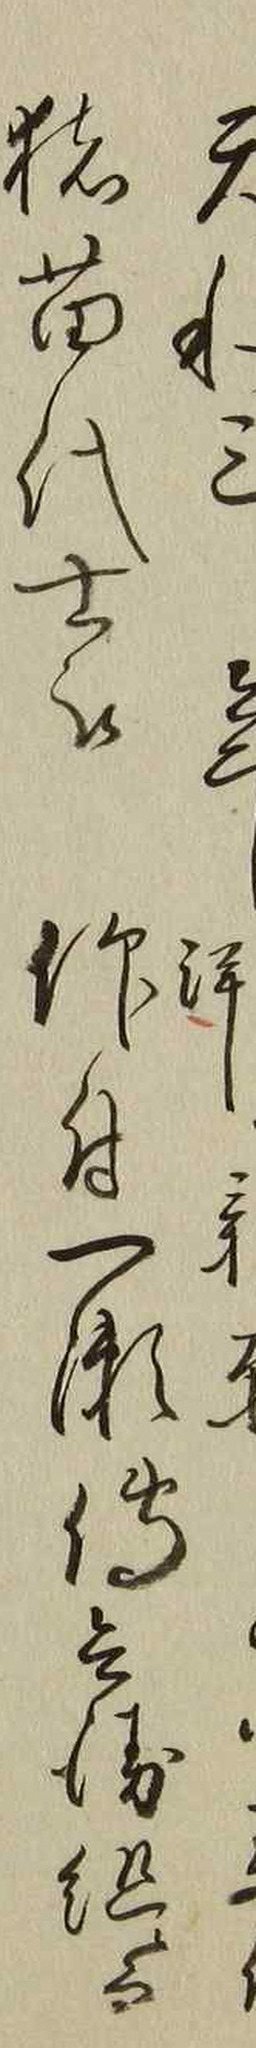猪苗代士被仰付一瀬伝兵衛組に而
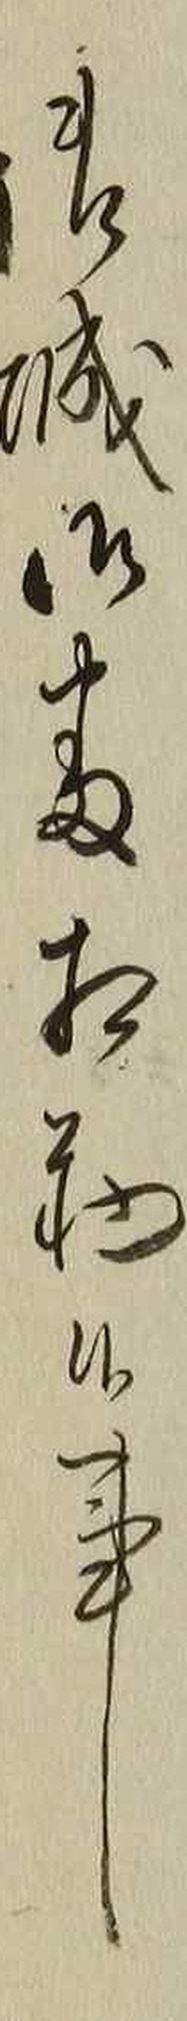御城御番相勤候事
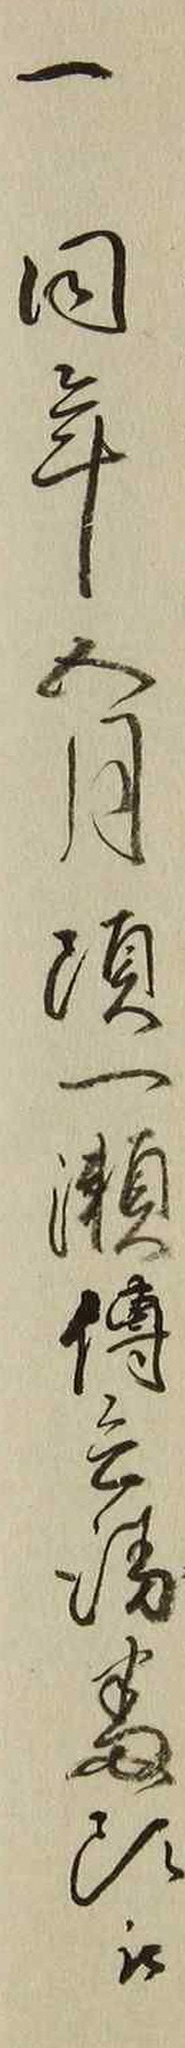一同年五月頭一瀬伝兵衛番頭被
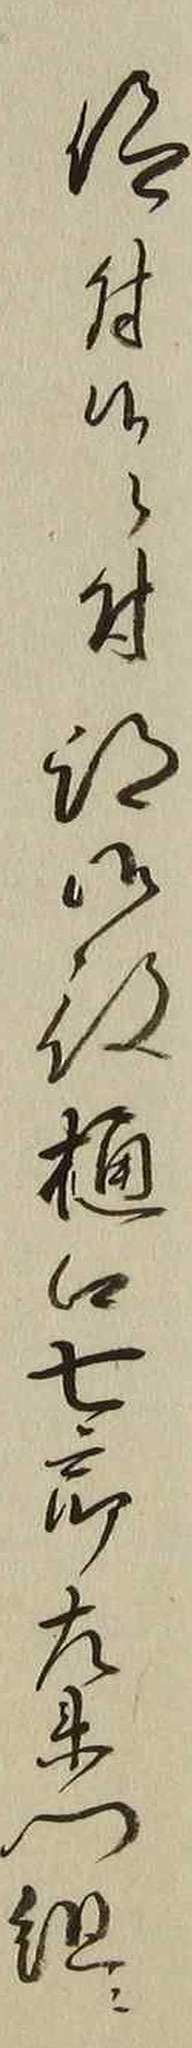仰付候に付事跡御役樋口七郎左衛門組に
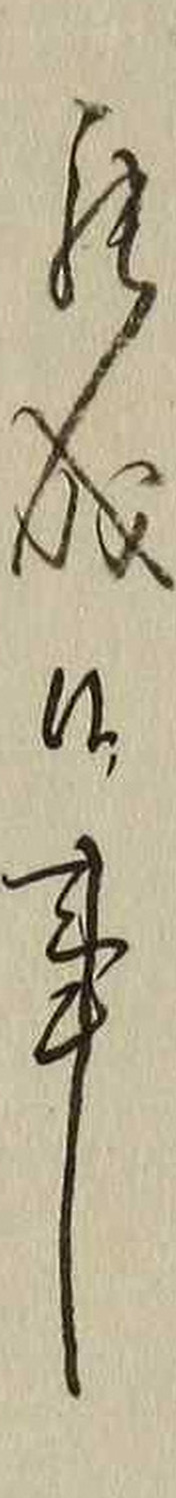罷成候事
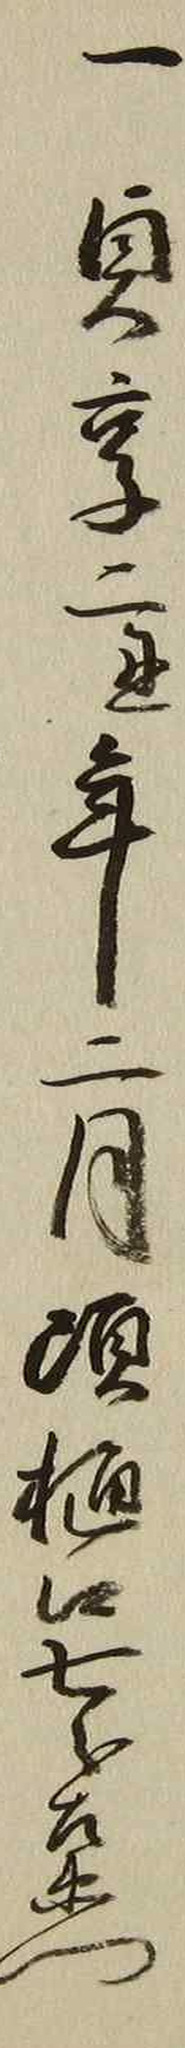一貞享二丑年二月頭樋口七郎左衛門
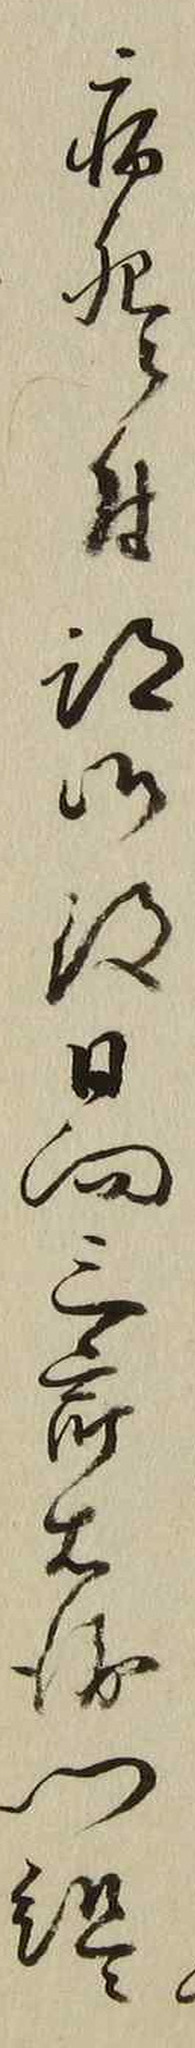病死に付跡御役日向三郎右衛門組に
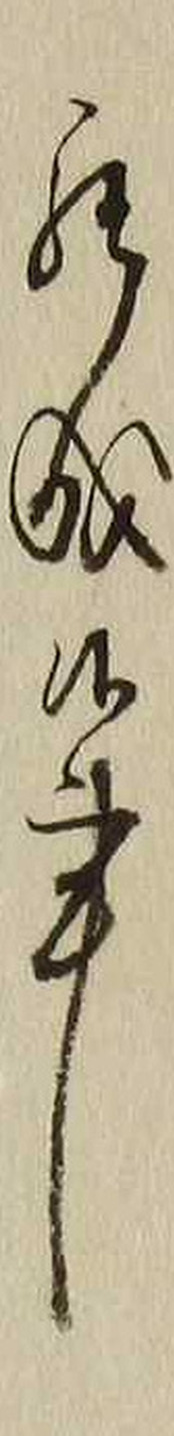罷成候事
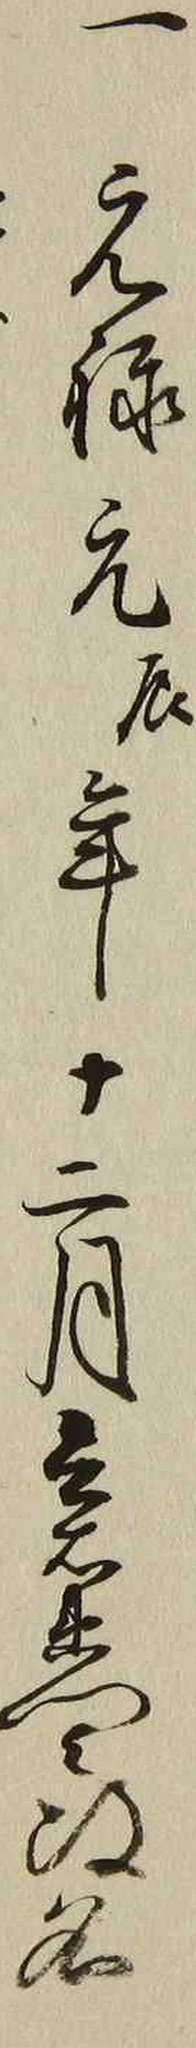一元禄元辰年十二月兵右衛門と改名
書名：諸士系譜　巻之1　い之部1
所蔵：会津若松市立会津図書館
